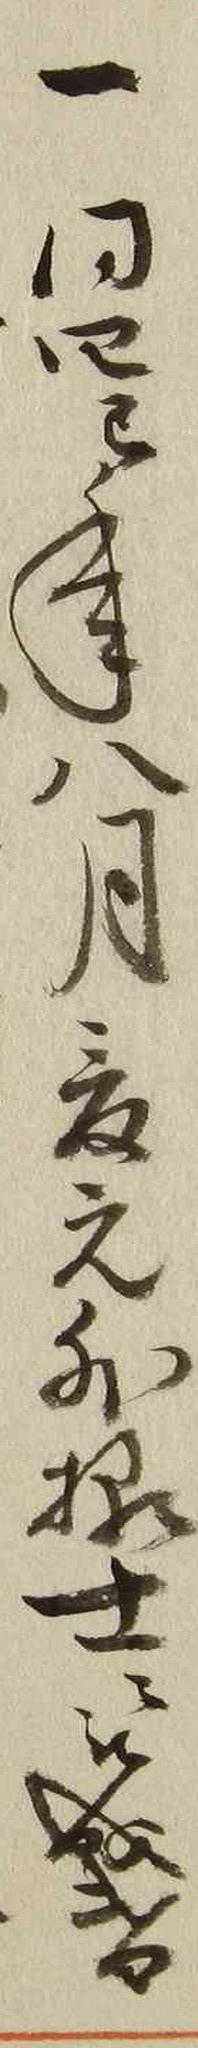一同四巳年八月爰元外様士ニ被成替
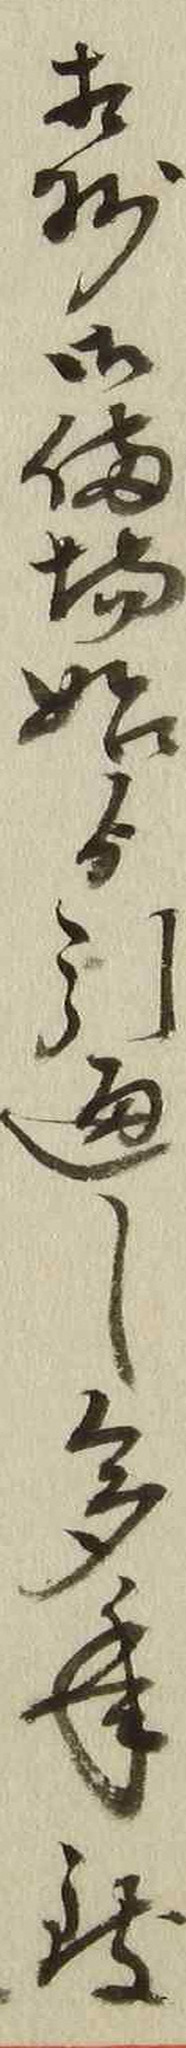相州御備場始ゟ引通し多年致
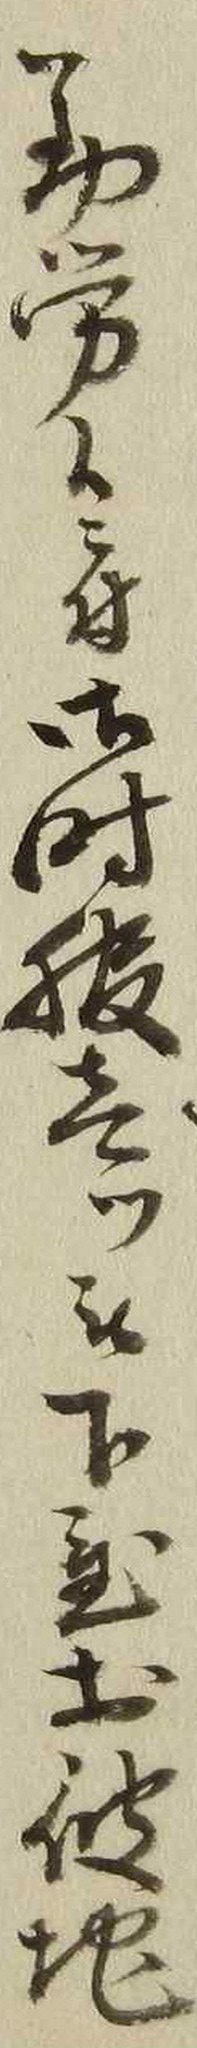勤労候ニ付御時服壱ツ被下置於彼地
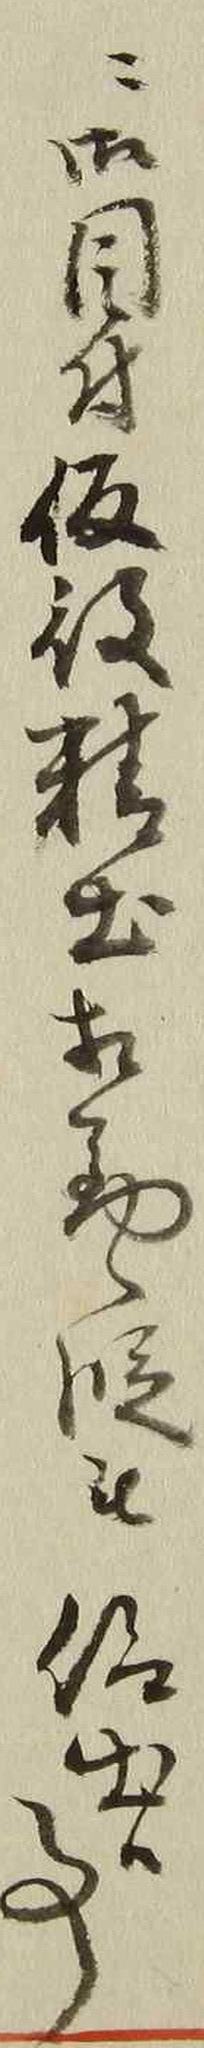ニ御目付仮役精出相勤候段被仰出候事
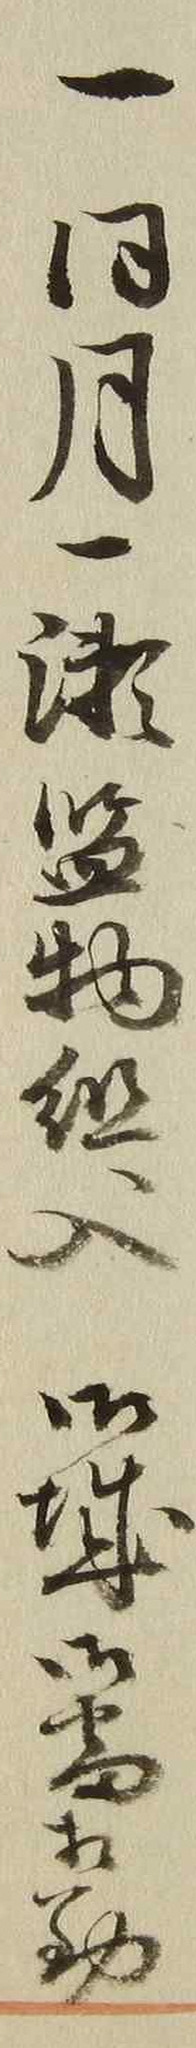一同月一瀬監物組へ入御城御番相勤
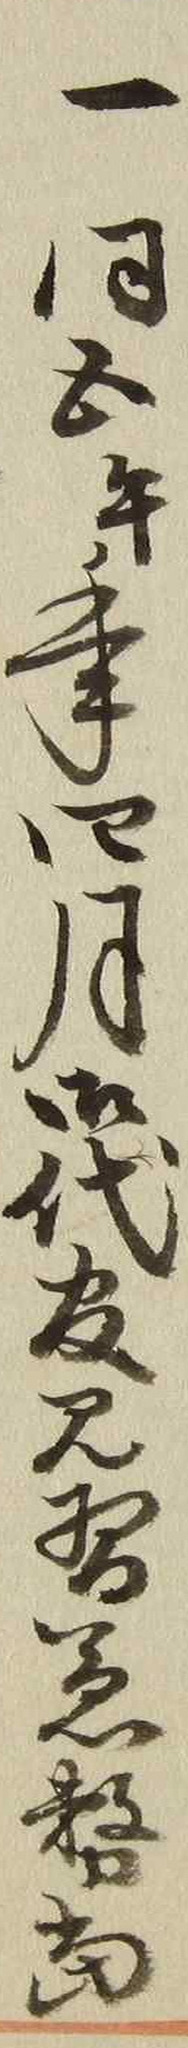一同五午年四月御代官見習兼務当
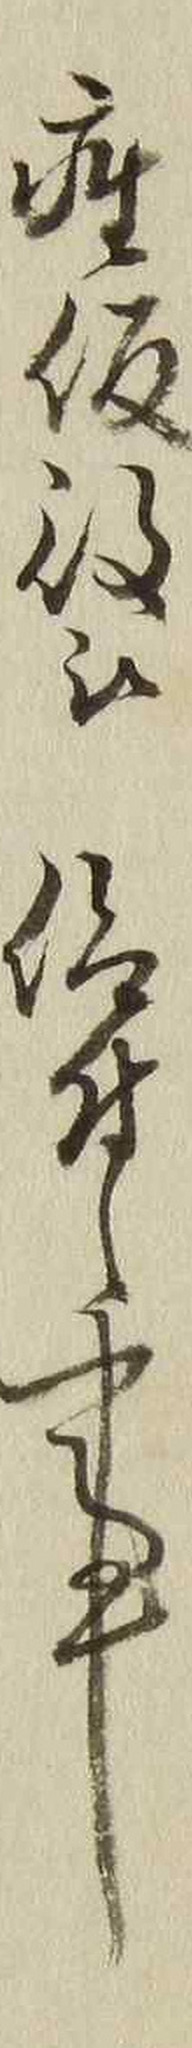座仮役被仰付候事
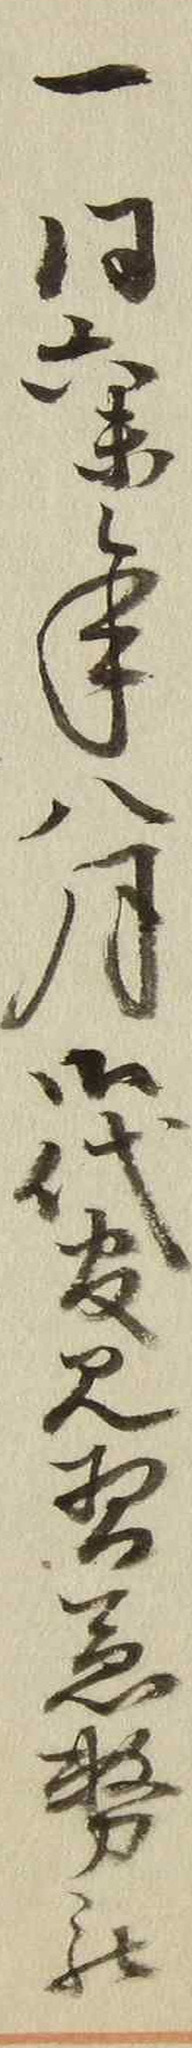一同六未年八月御代官見習兼務被
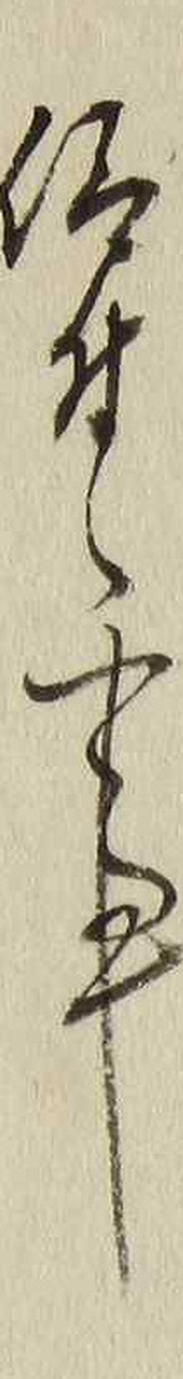仰付候事
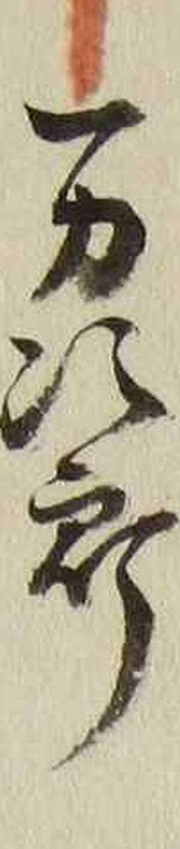万次郎
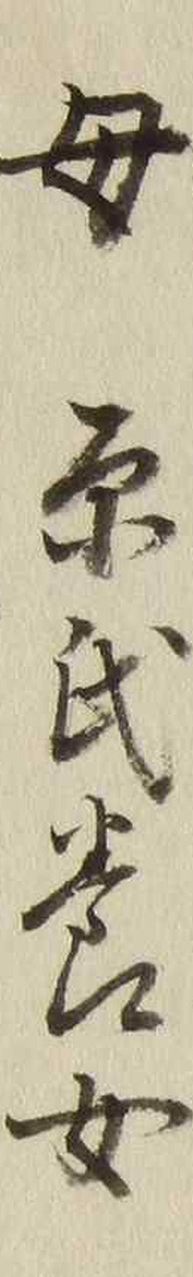母原氏養女
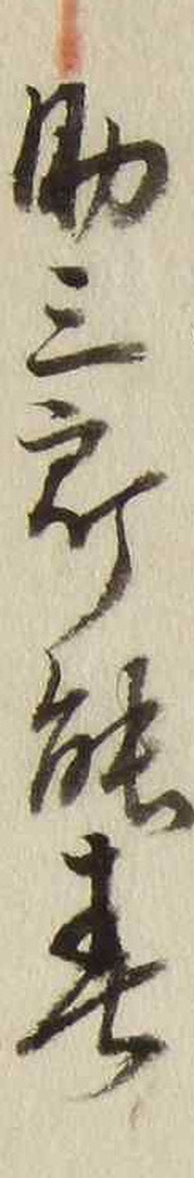助三郎能春
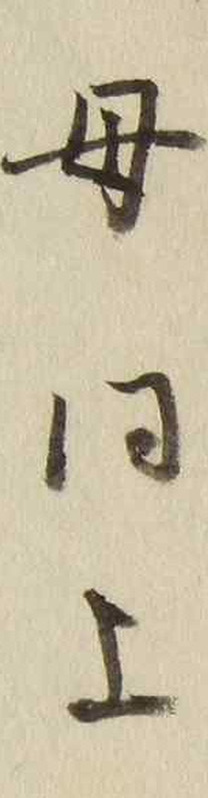母同上

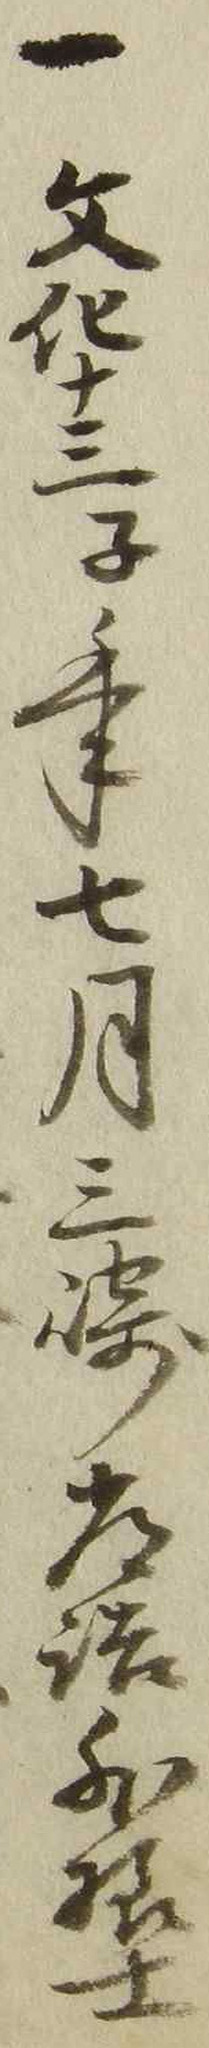一文化十三子年七月三崎常詰外様士
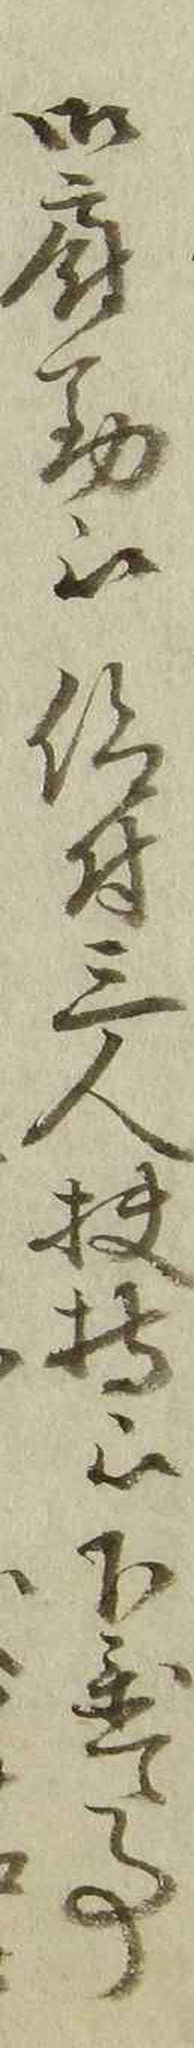御雇勤被仰付三人扶持被下置候事
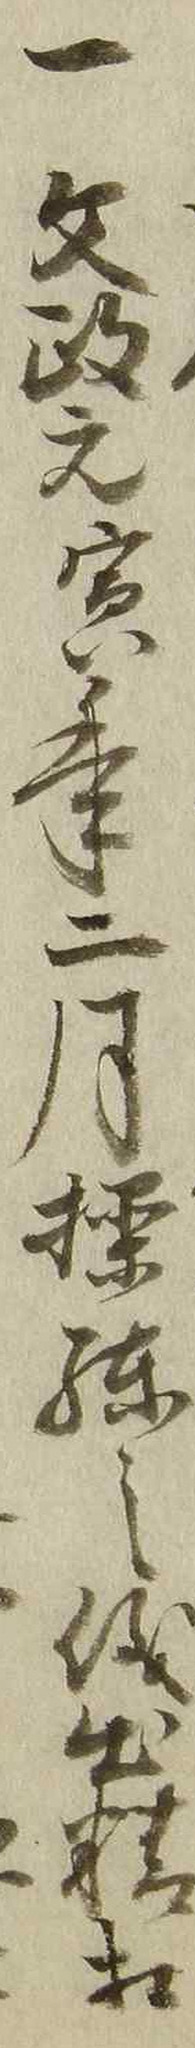一文政元寅年二月操練之儀出精相
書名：諸士系譜　巻之53　に之部4
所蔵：会津若松市立会津図書館
